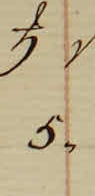5
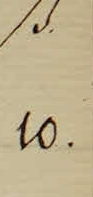10
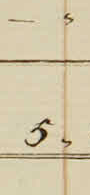5
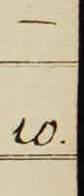10
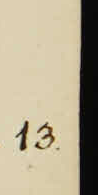13.
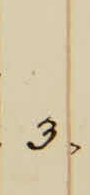3
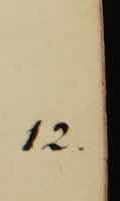12.
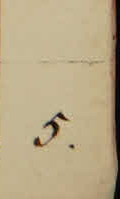5.
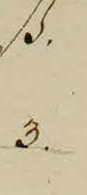3.
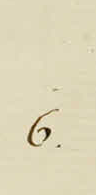6.
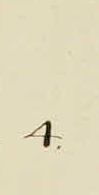4.
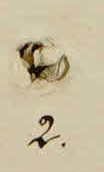2.
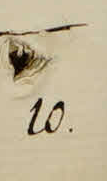10.
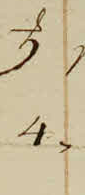4
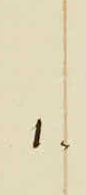1
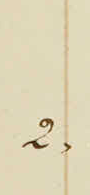2
